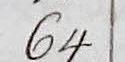64
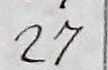27
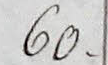60
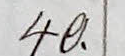40.
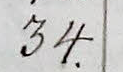34
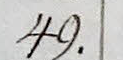49.
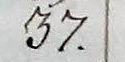37.
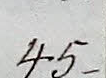45
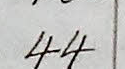44
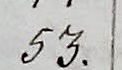53.
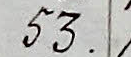53.
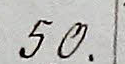50.
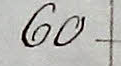60
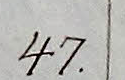47.
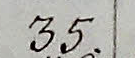35.
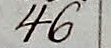46
